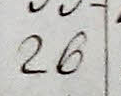26
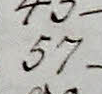57
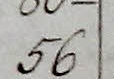56
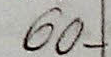60
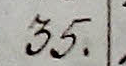35.
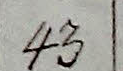43
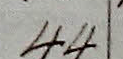44
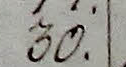30.
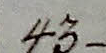43
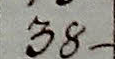38
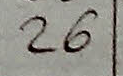26
